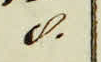8.
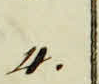4.
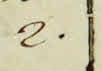2.
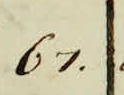67.
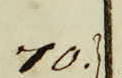70.
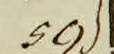59
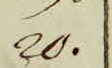20.
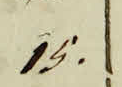15.
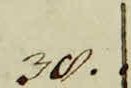38.
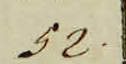52
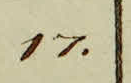17.
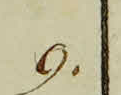9.
